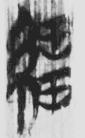{糸畕}（陳）
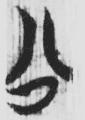公
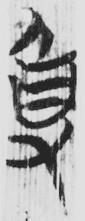事
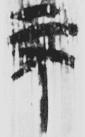不
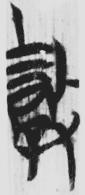○（穀）
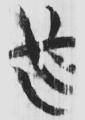必
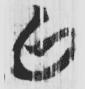㠯（以）
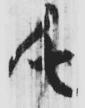氏（是）
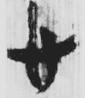心
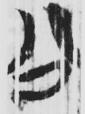公
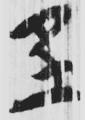○（坐）
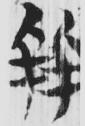○（拜）
